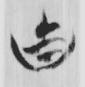由
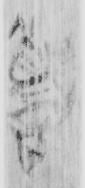{言蔑}
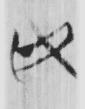女
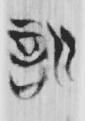訓
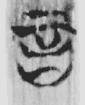言
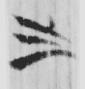之
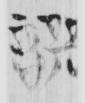譔
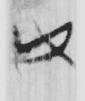女
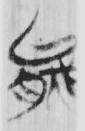能
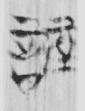{言鬲}
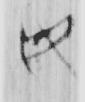女
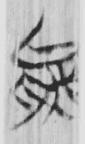能
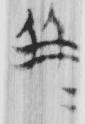并
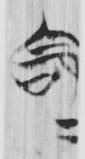命
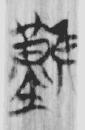難
